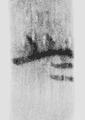{廿二}
